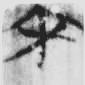宋
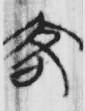客
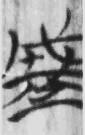盛
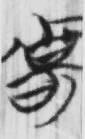甹（聘）
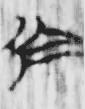於
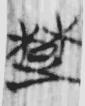楚
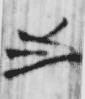之
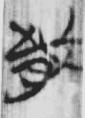歲（歲）
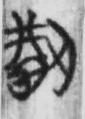荊（荆）
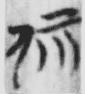𫵖
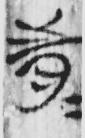之月
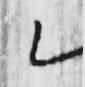乙
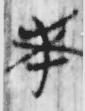未
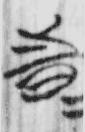之日
